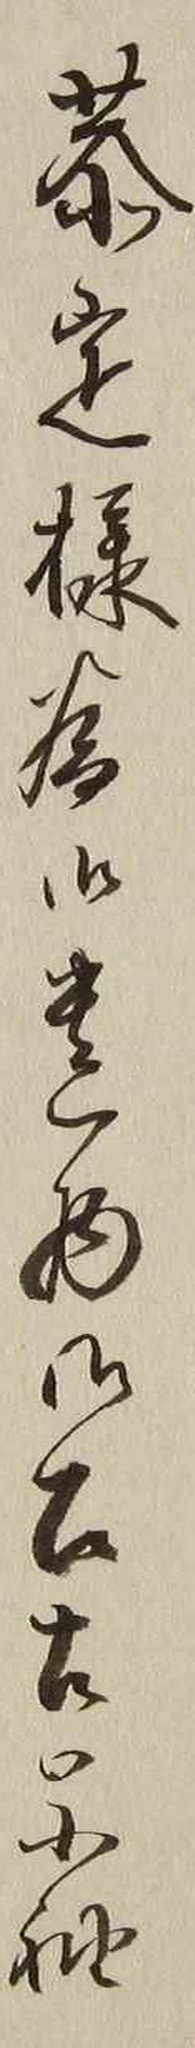恭定院様為御遺物御召古御小袖
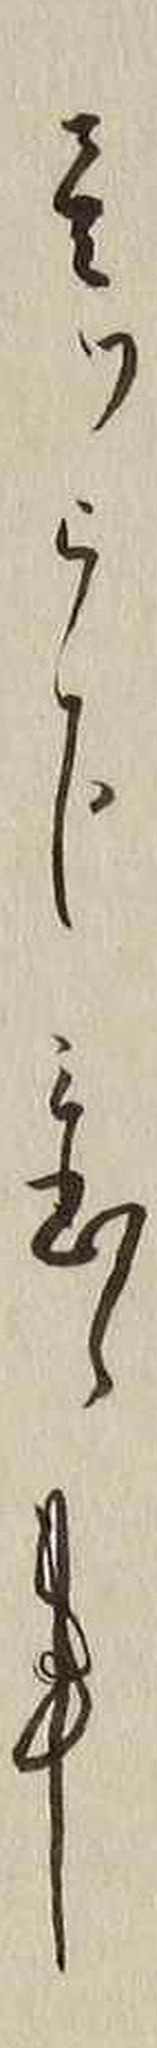壱ツ被下置候事
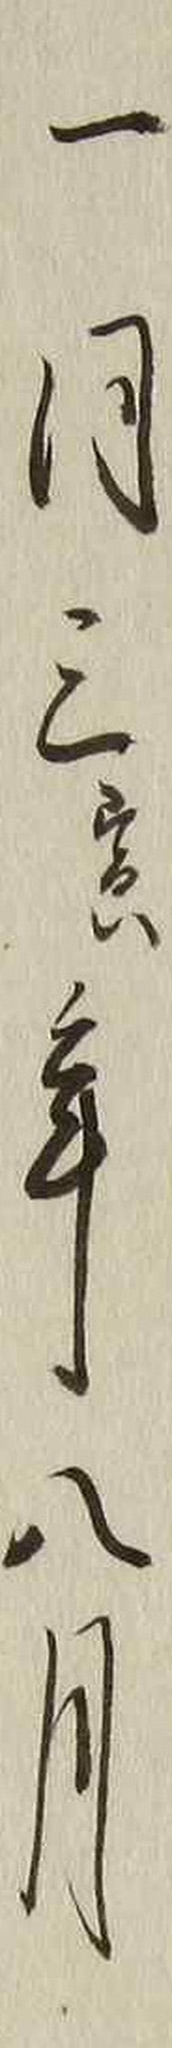一同三寅年八月
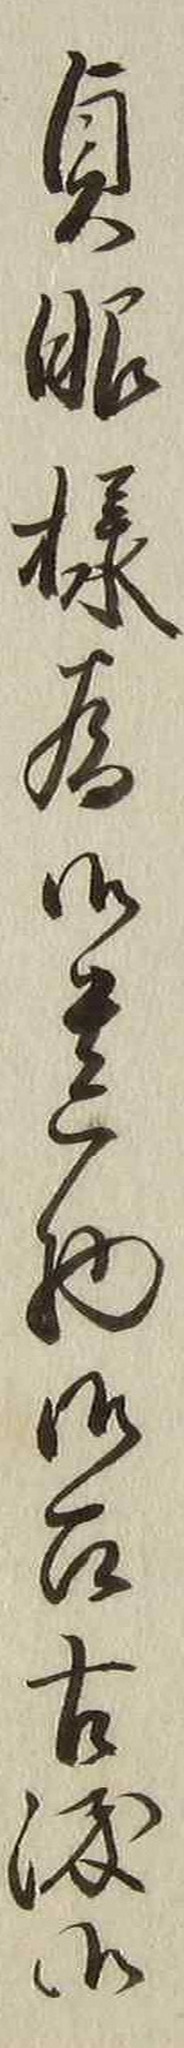貞昭様為御遺物御召古染御
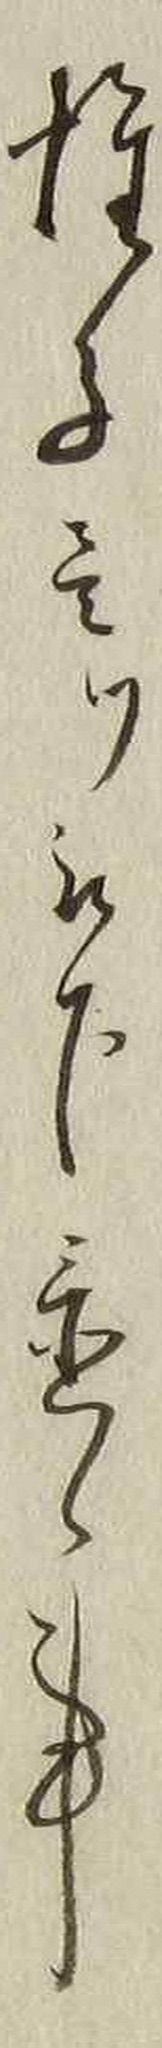帷子壱ツ被下置候事
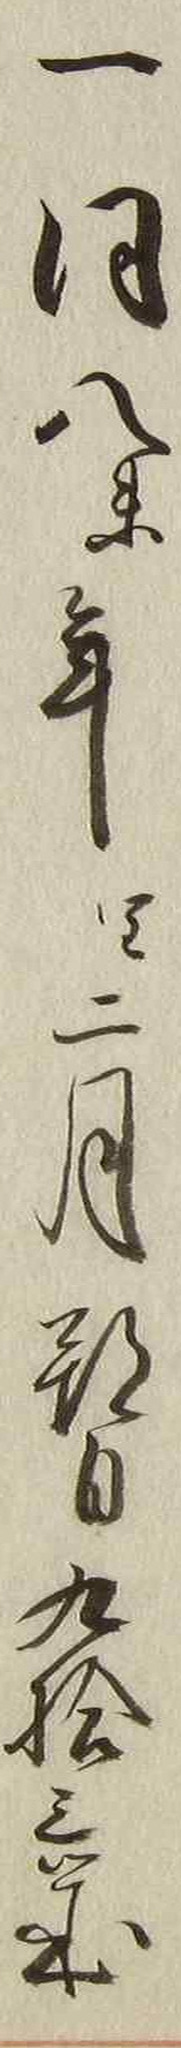一同八未年閏二月朔日九拾三歳
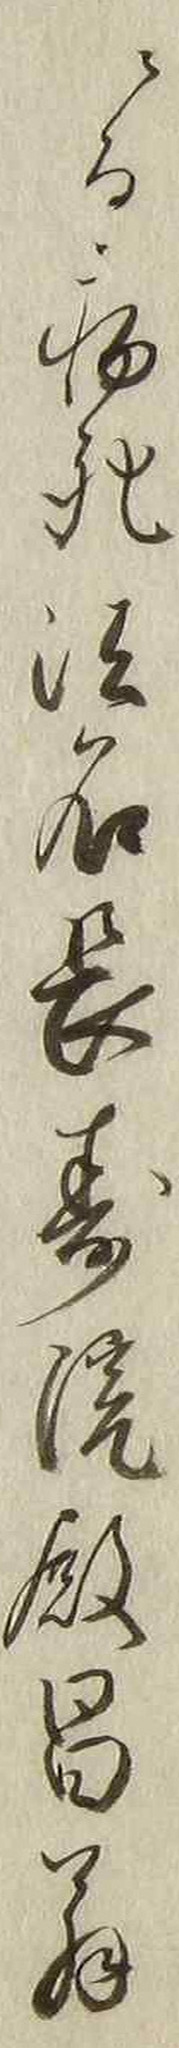ニ而病死法名長寿院殿昌翁
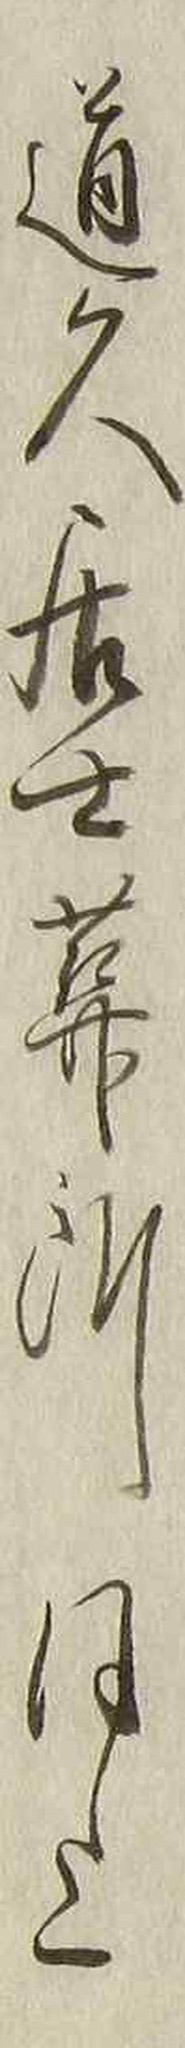道久居士葬所同上

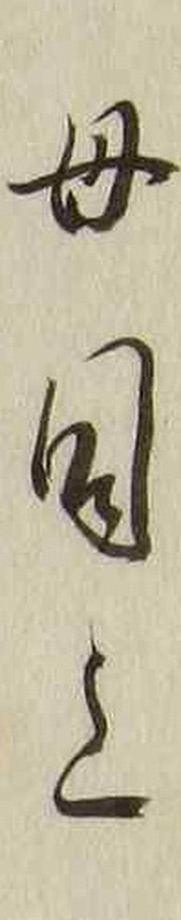母同上
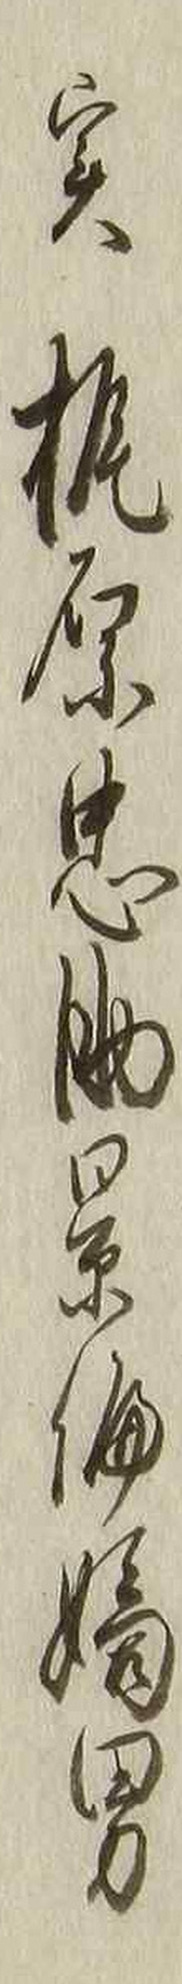実梶原忠助景偏嫡男
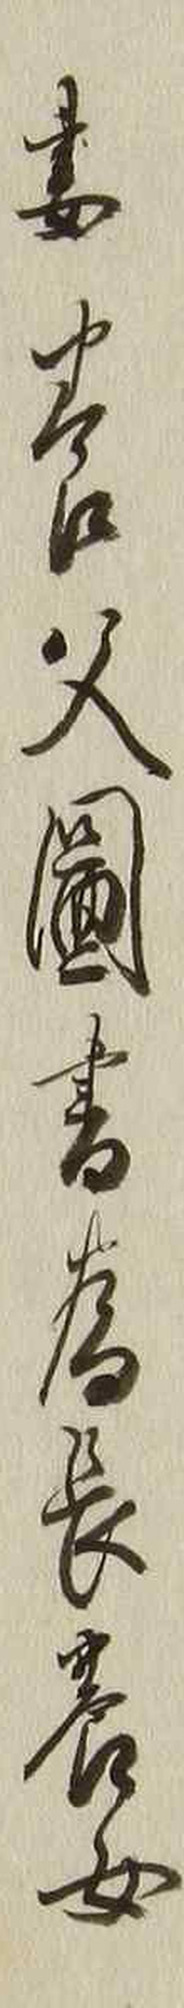妻養父図書為長養女
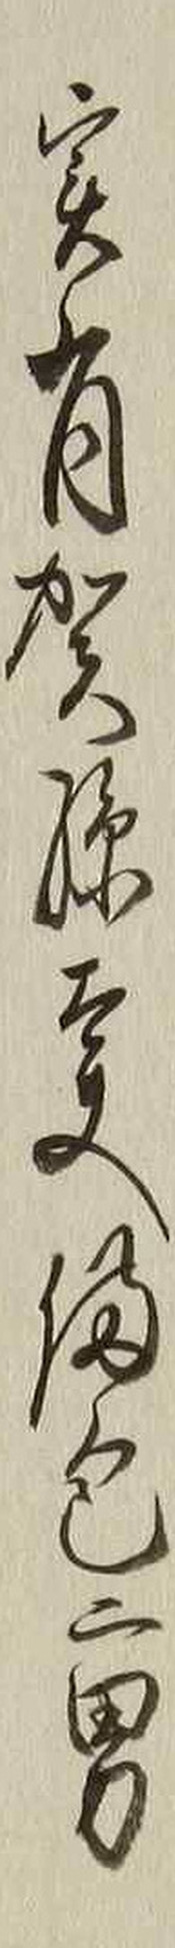実有賀孫太夫備包二男
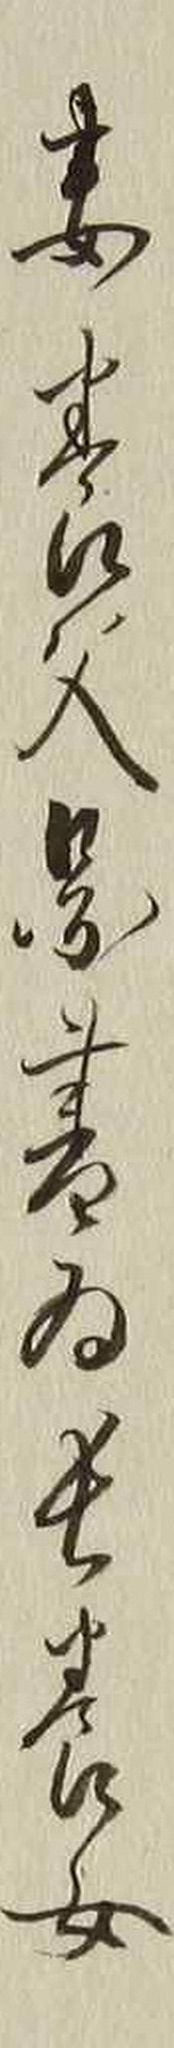妻養父図書為長養女
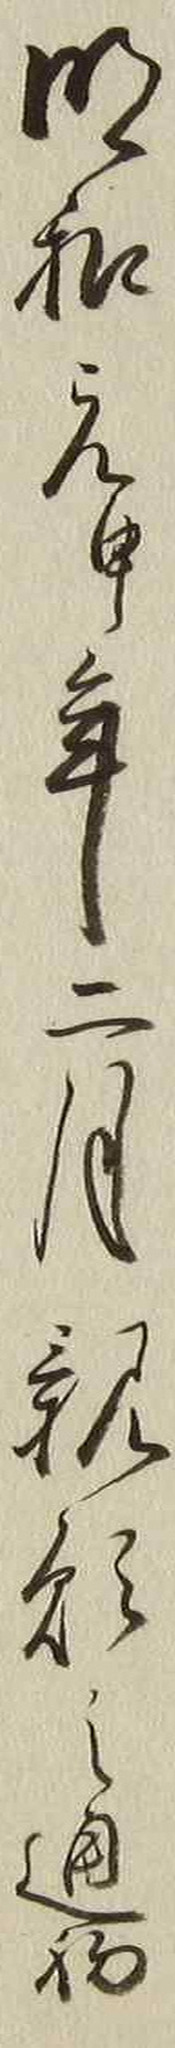明和元申年二月親願之通初
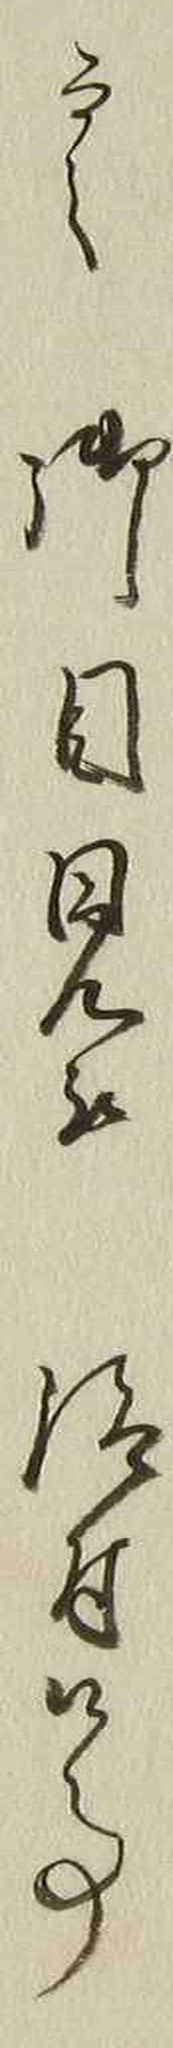而之御目見被仰付候事
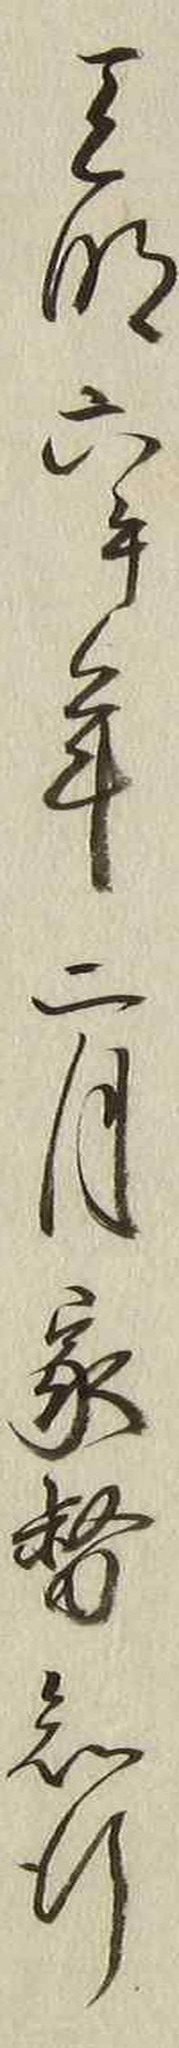天明六年午年二月家督知行
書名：諸士系譜　巻之18　い之部18
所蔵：会津若松市立会津図書館
